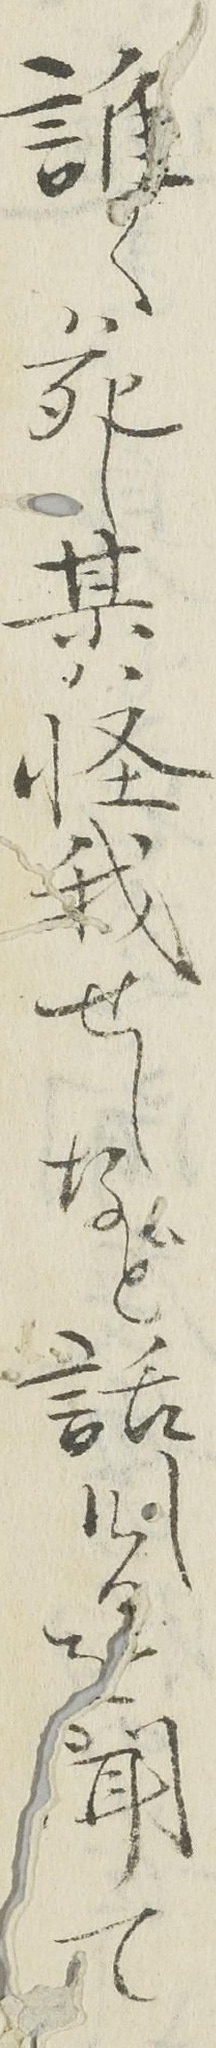誰々ハ死し某ハ怪我せしなど話を聞て

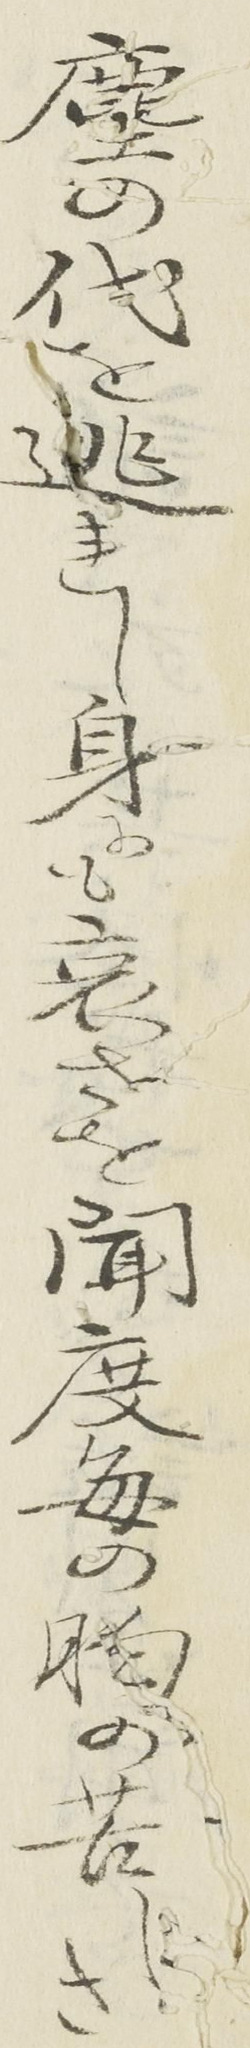塵の代を逃れし身にも哀さを聞度毎の棟の苦しさ
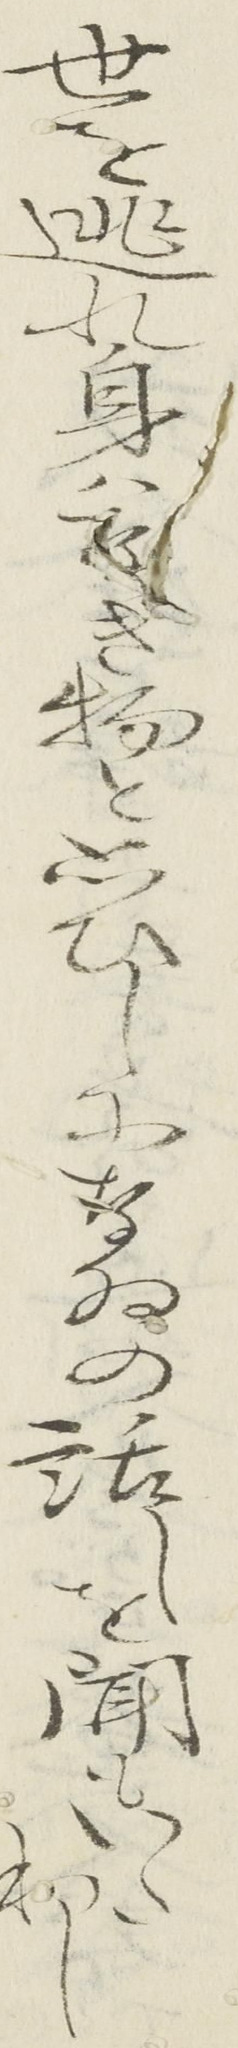世を逃れを身ハなき物と思ひしになゐの話しを聞もいたわし
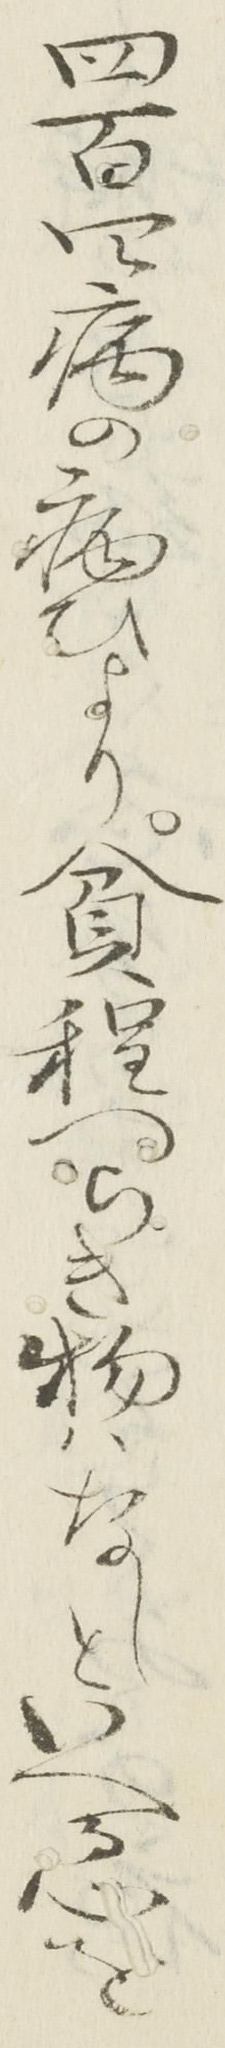四百四病の病ひより貧程つらき物ハなしといへる心を
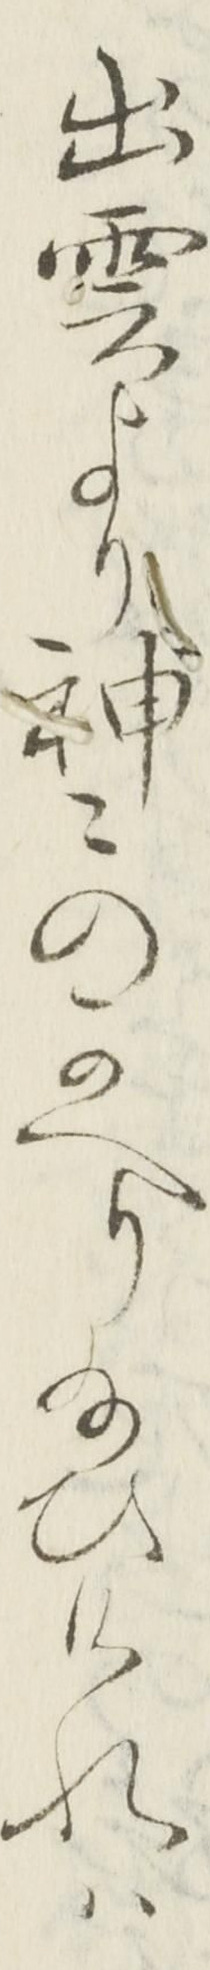出雲より神々のかへりたまひけれハ
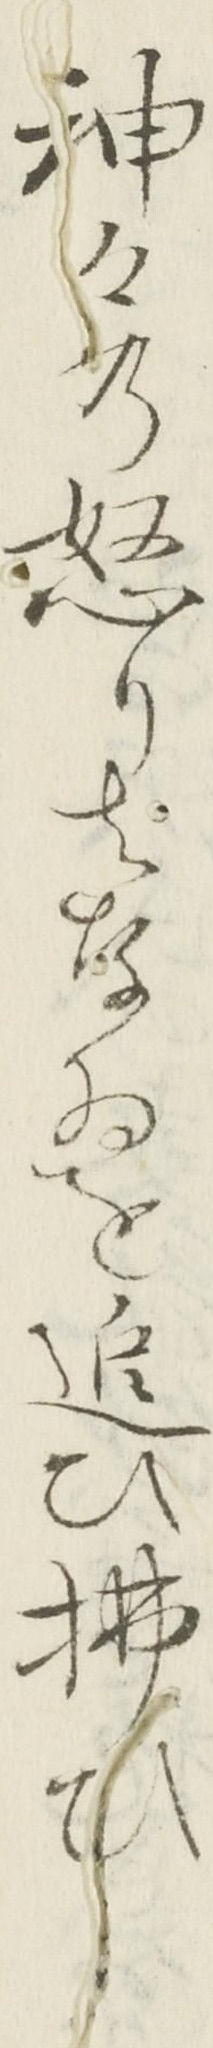神々の怒りはなゐう追払ひ
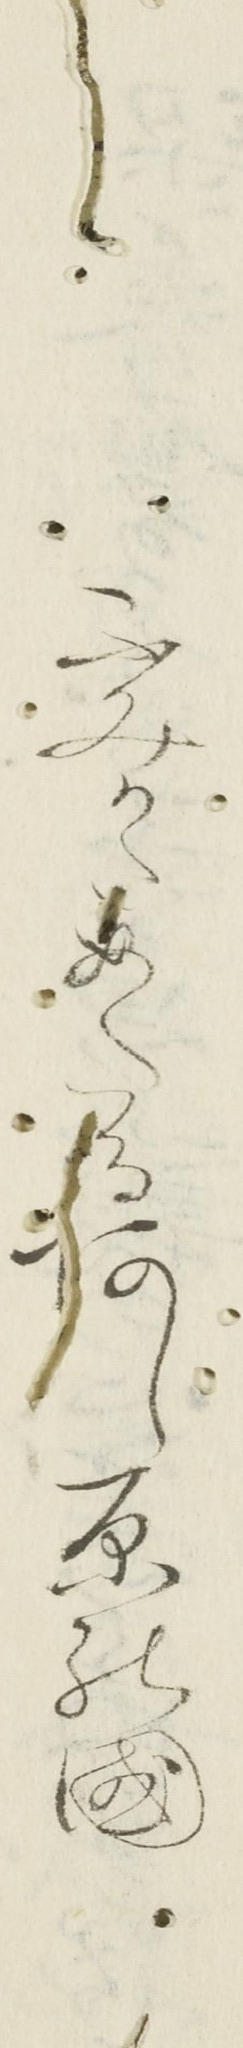ふみかためたるあし原の国
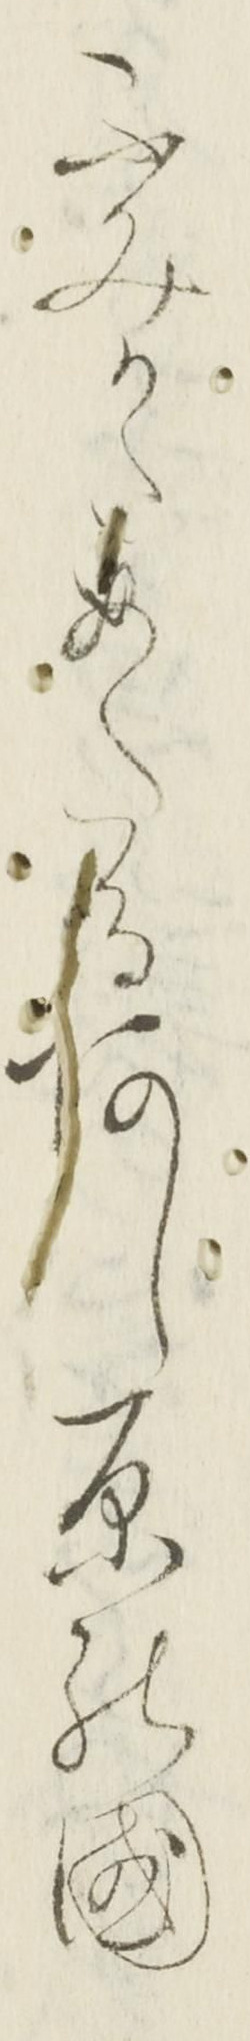ふみかためたるあし原の国
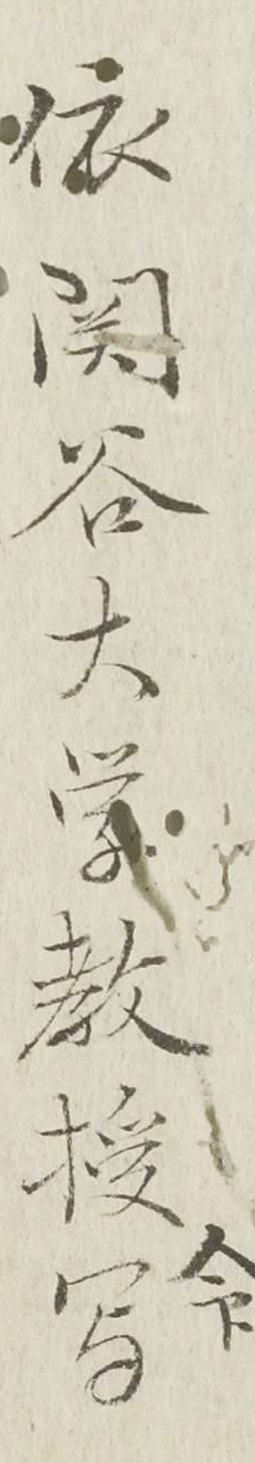依関谷大学教授写
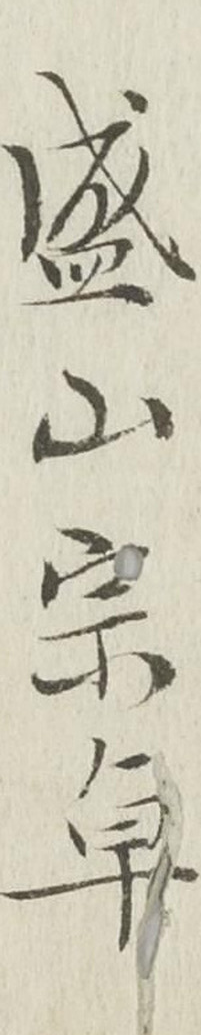盛山宗卓
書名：地震考證　全
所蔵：東京大学地震研究所図書室 Earthquake Research Institute Library, The University of Tokyo, JAPAN
